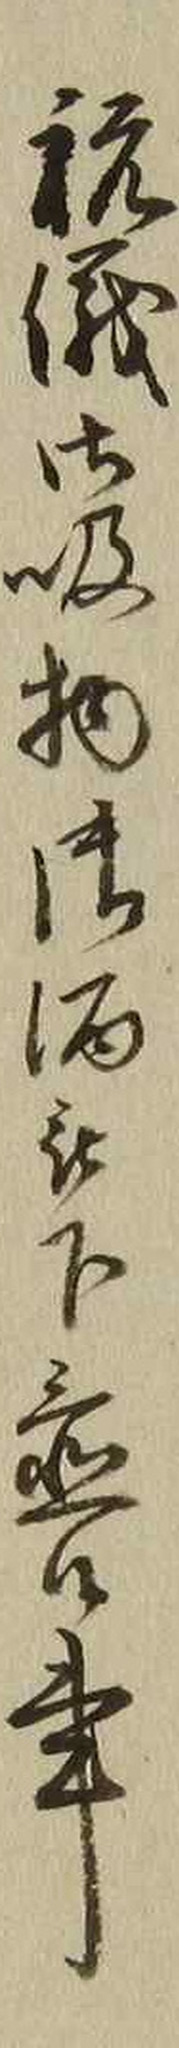祝儀御吸物御酒被下置候事
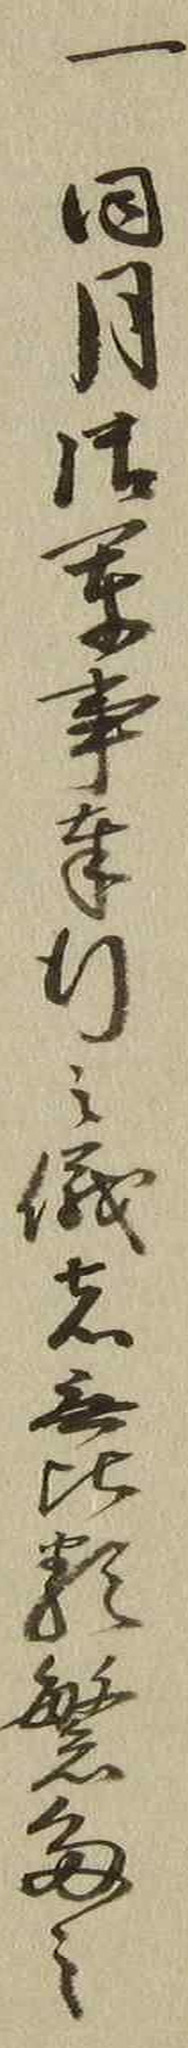一同月御軍事奉行之儀は無比類繁多之
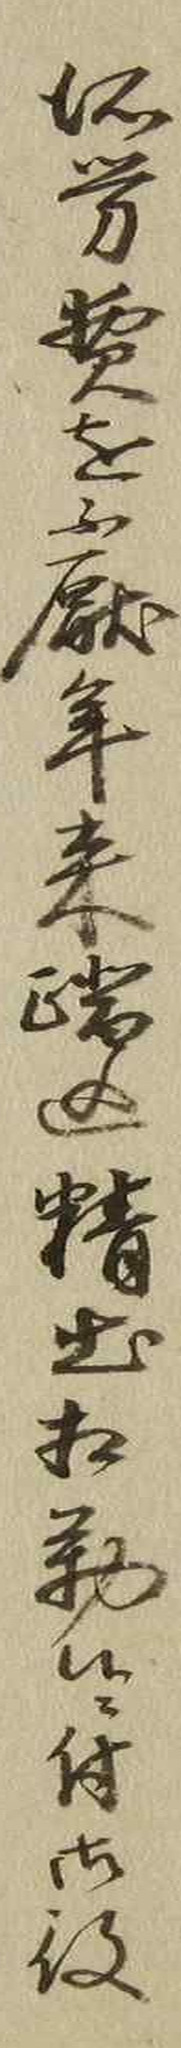所労費を不厭年来踏込精出相勤候に付御役
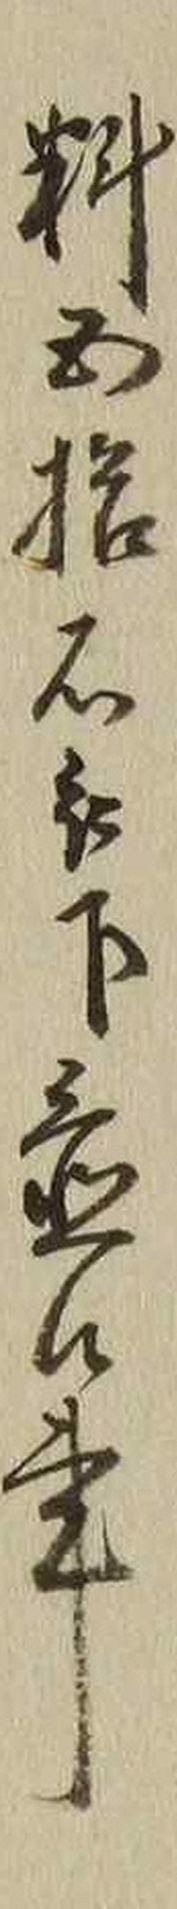料五拾石被下置候事
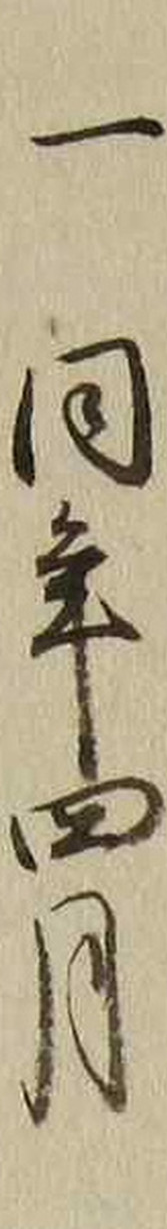一同年四月
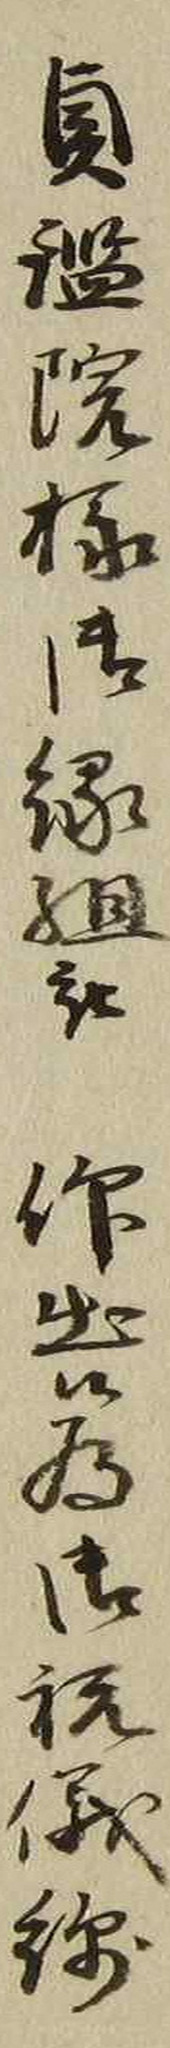貞鑑院様御縁組被仰出候為御祝儀綿
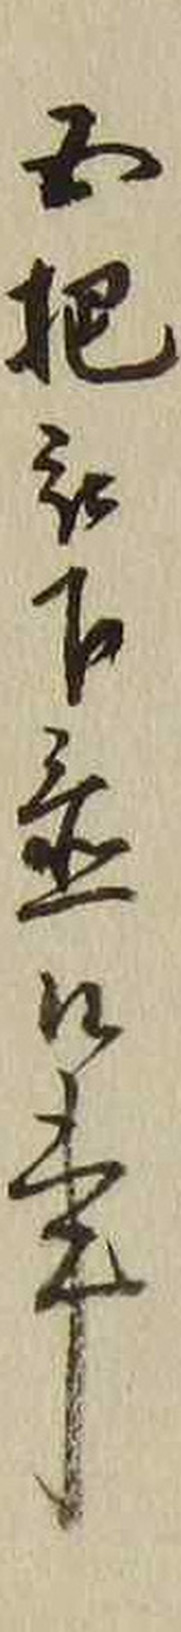五杷被下置候事
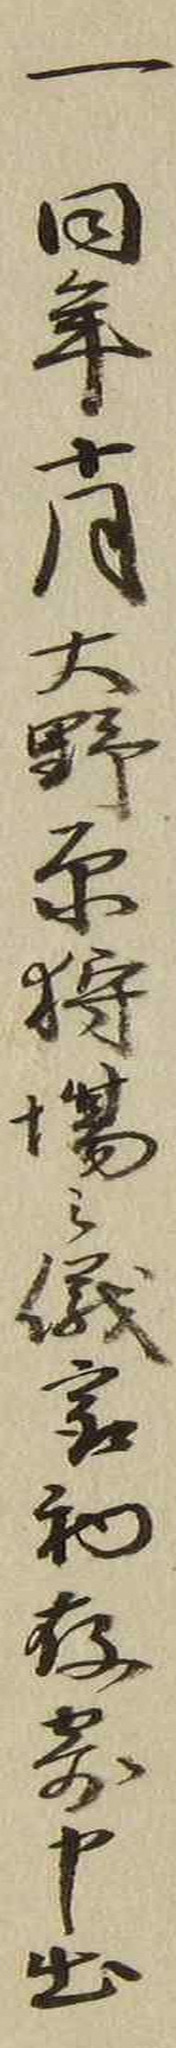一同年十月大野原狩場之儀最初存寄申出
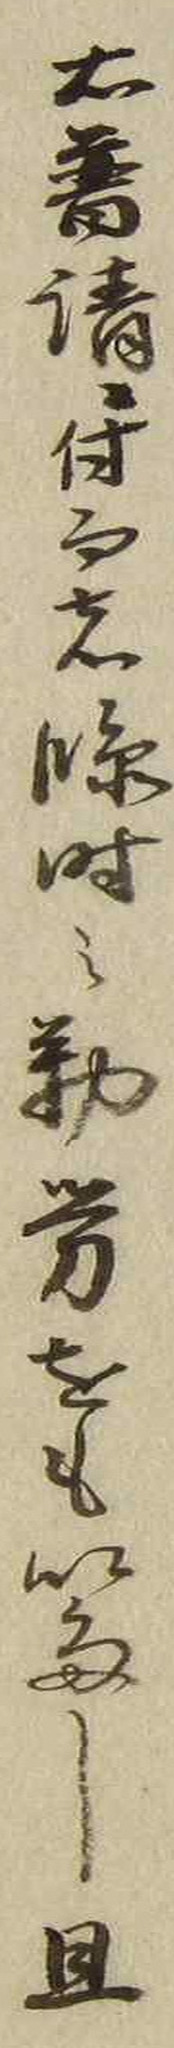右普請に付而は臨時之勤労をもいたし且
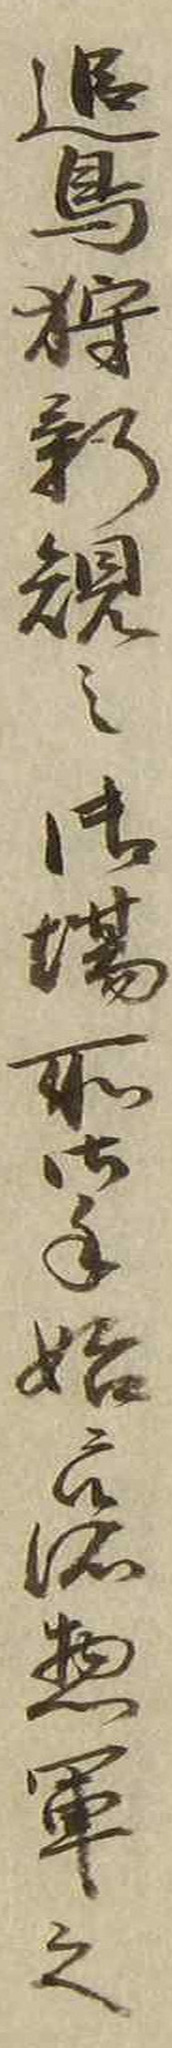追鳥狩新規之御場所御手始に候所惣軍之

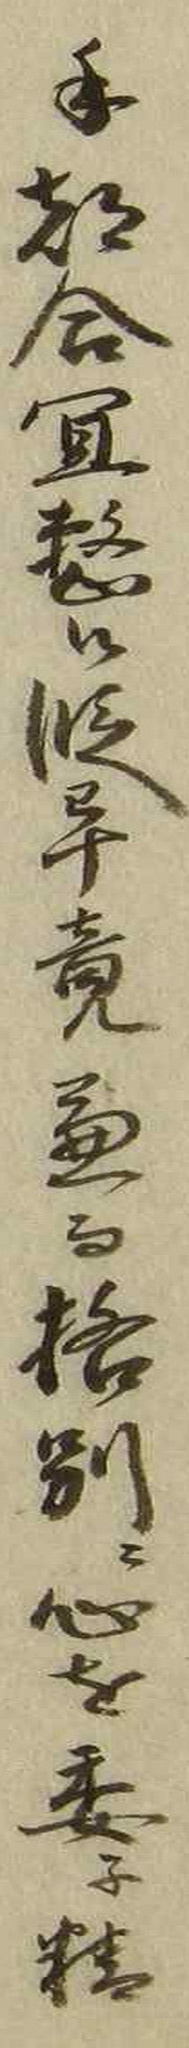手都合宜整候段畢竟兼而格別に心を委ね精
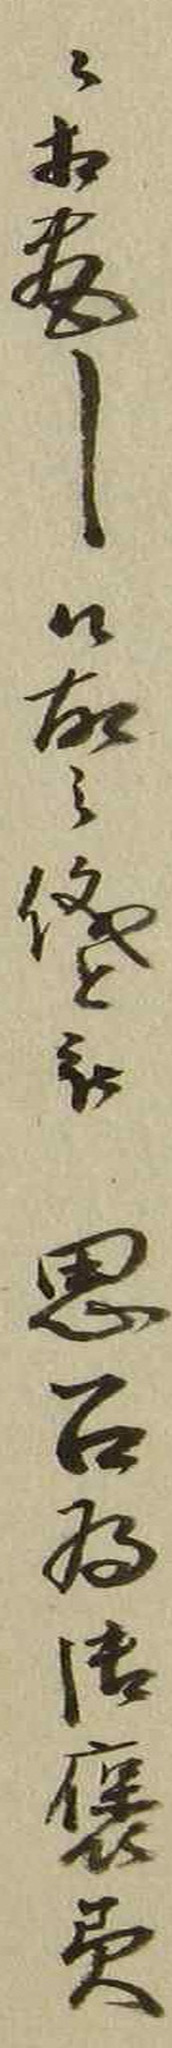々相尽し候故之儀と被思召為御褒美
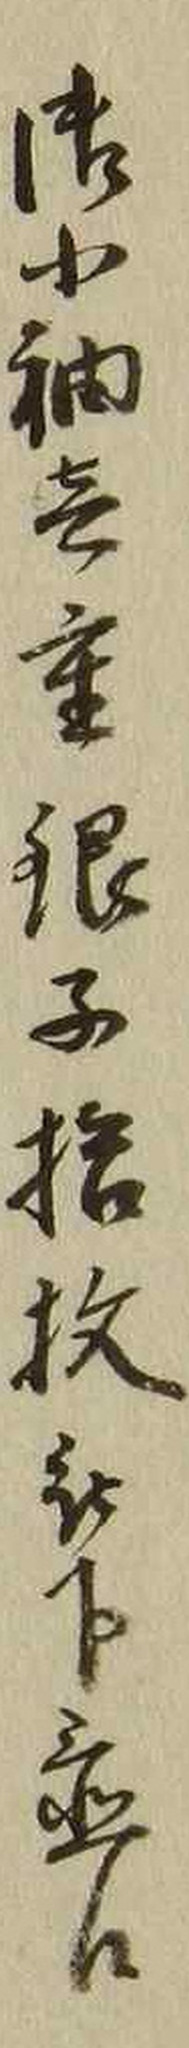御小袖壱重銀子拾枚被下置候
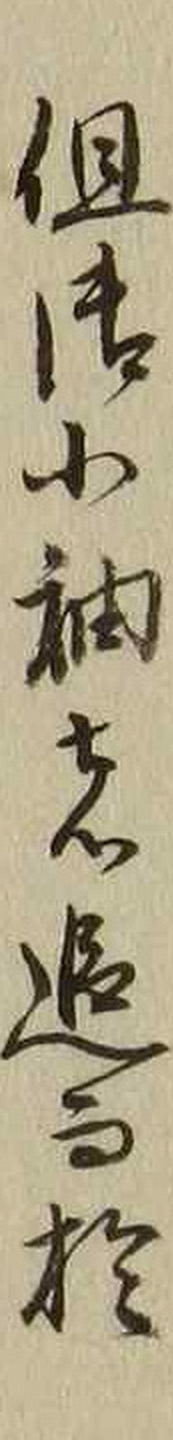但御小袖は追而於
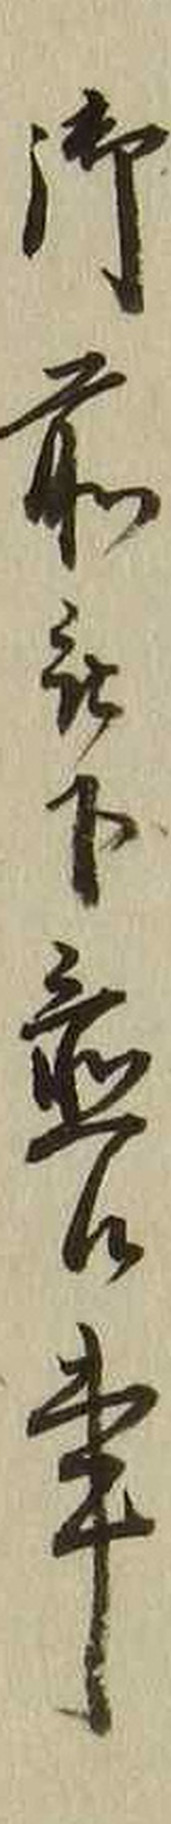御前被下置候事
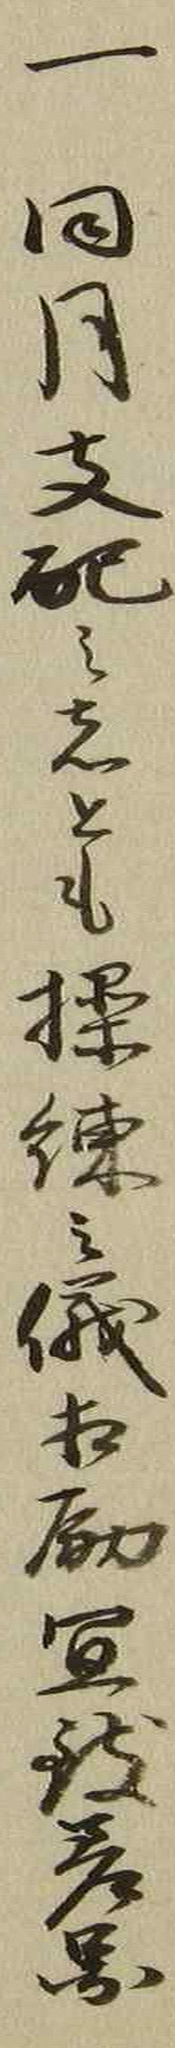一同月支配之者とも操練之儀相励宜致差図
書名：諸士系譜　巻之133　た之部9
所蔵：会津若松市立会津図書館
